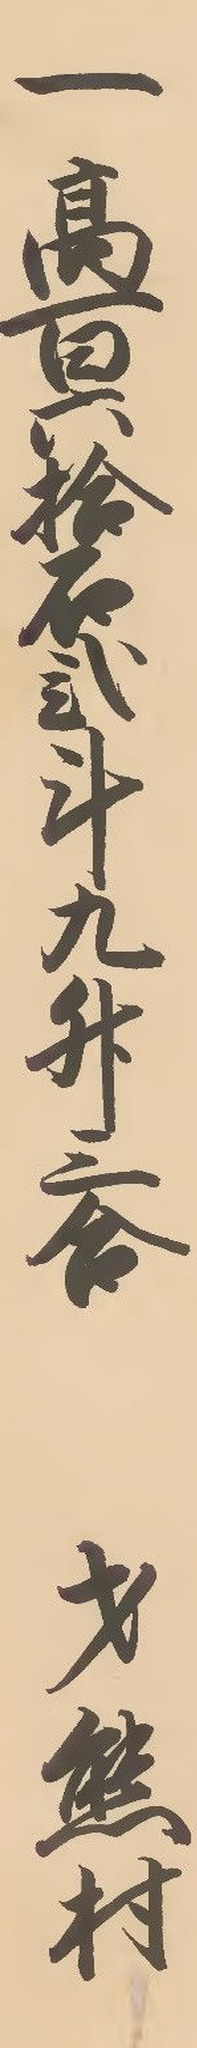一高百拾石弐斗九升三合才熊村

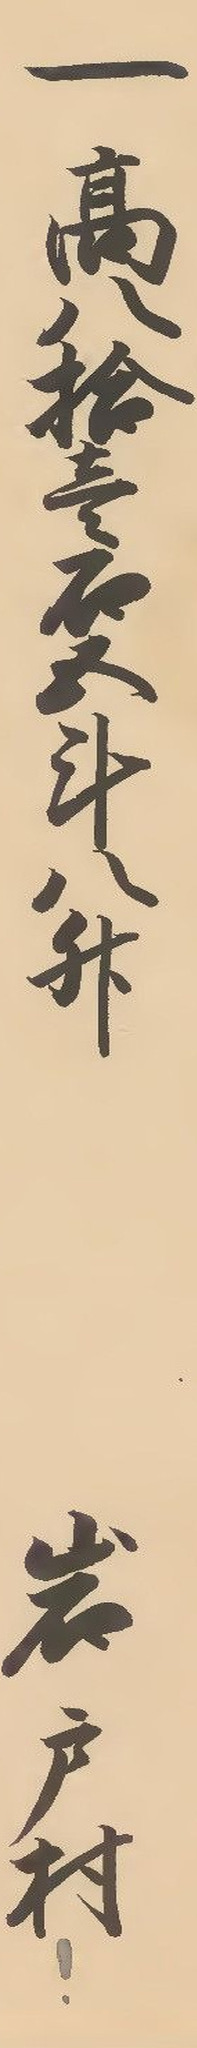一高八拾壱石五斗八升岩戸村
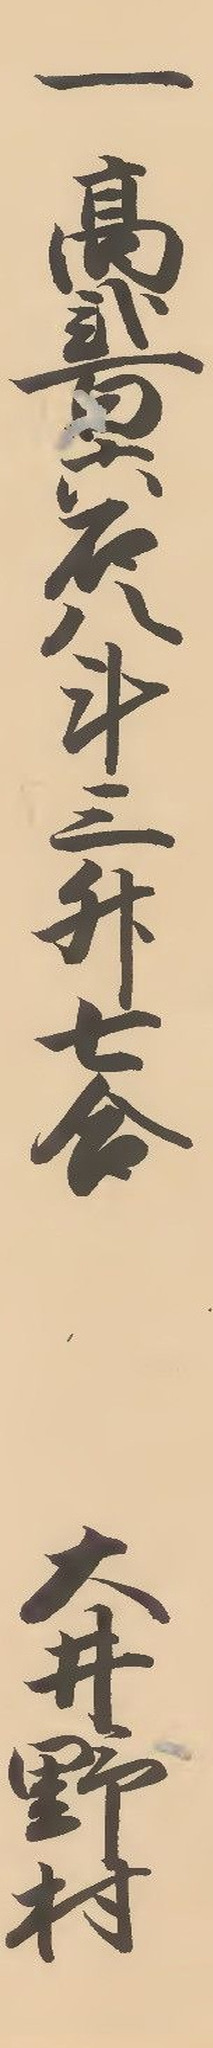一高弐百六石八斗三升七合大井野村
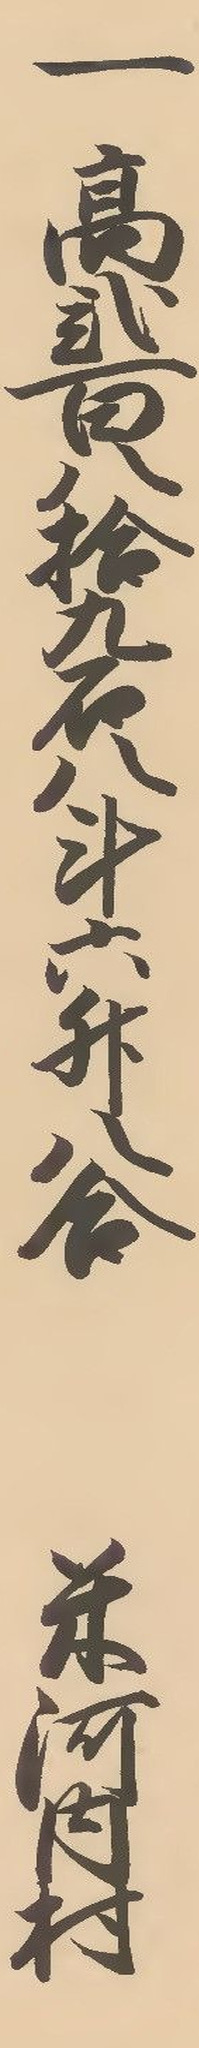一高弐百八拾九石八斗六升八合米河内村
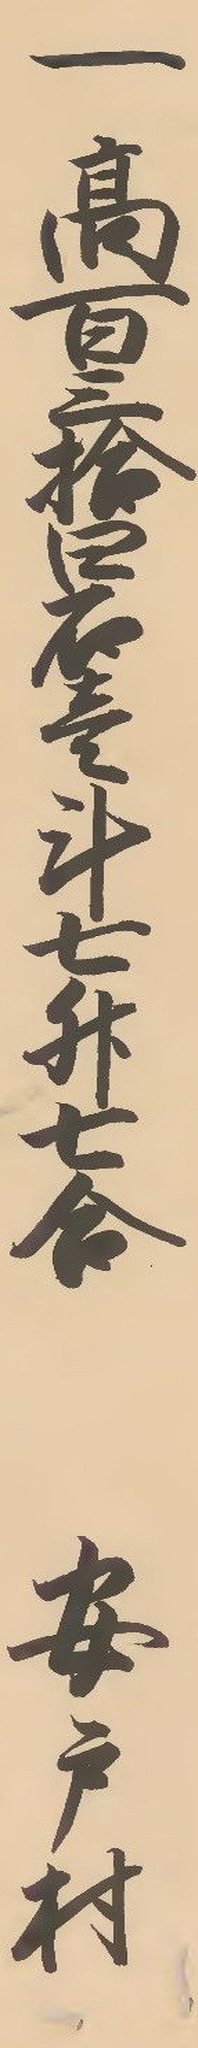一高百三拾四石壱斗七升七合安戸村
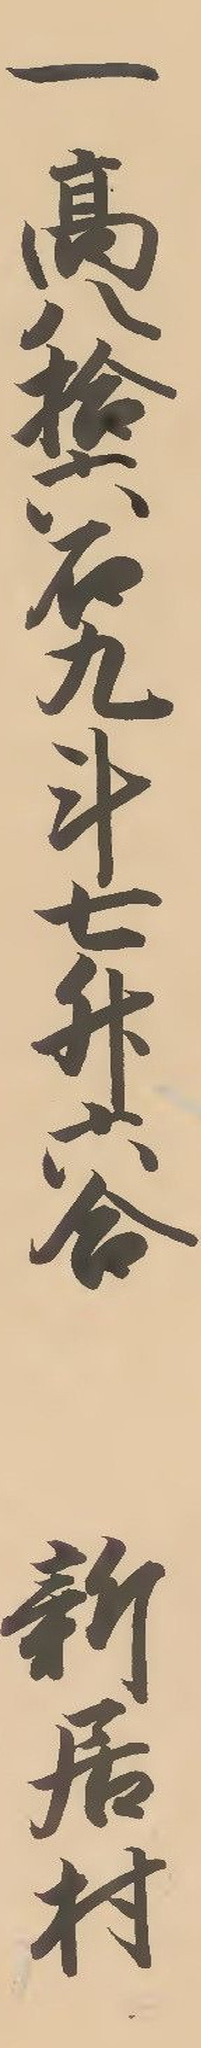一高八拾六石九斗七升六合新居村
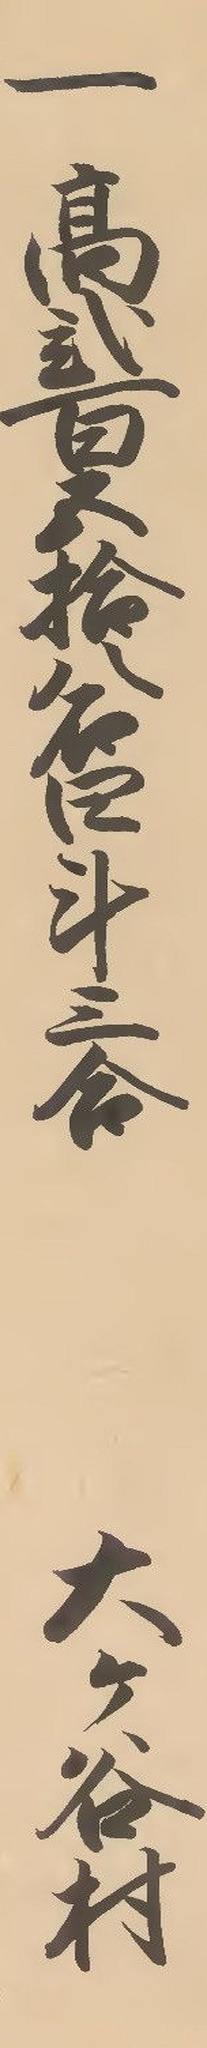一高弐百五拾八石四斗三合大ヶ谷村
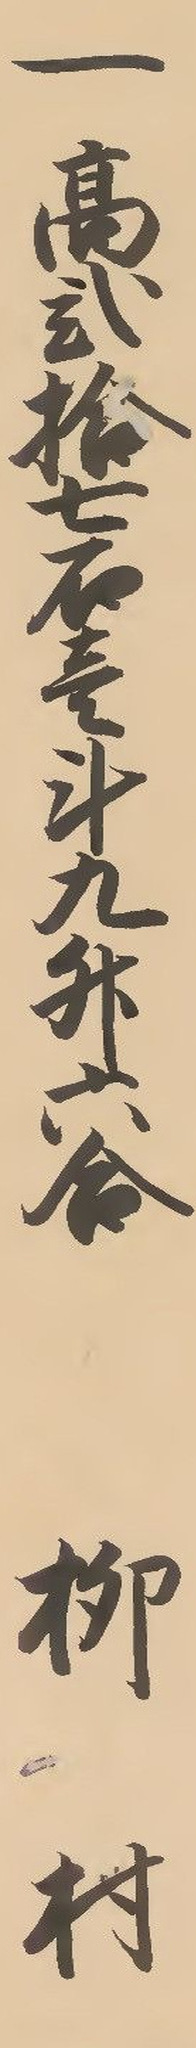一高弐拾七石壱斗九升六合柳村
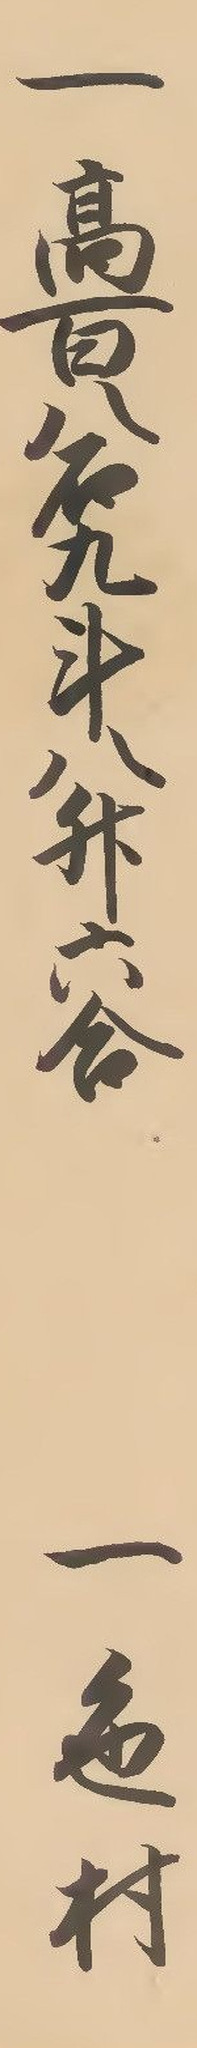一高百八石九斗八升六合一色村

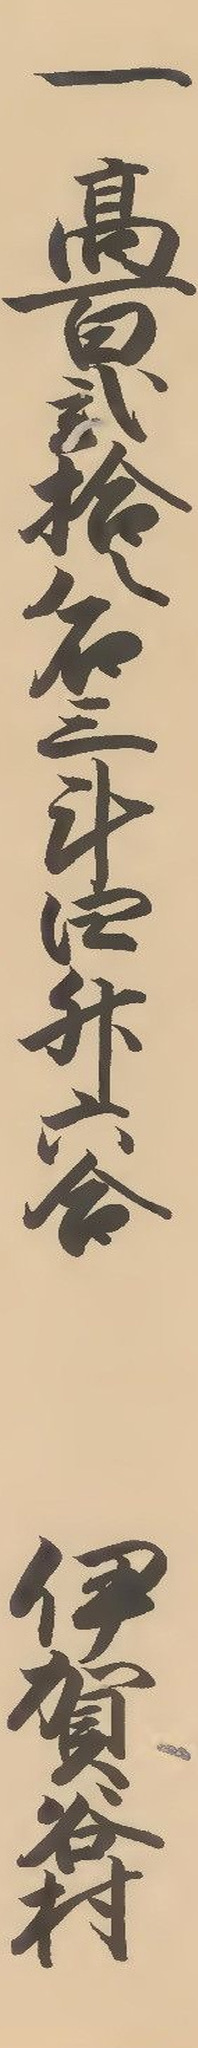一高百弐拾八石三斗四升六合伊賀谷村
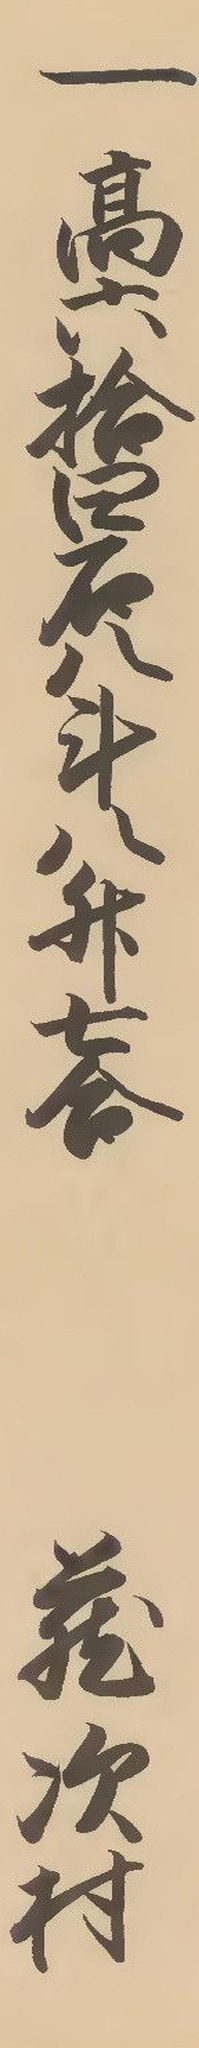一高六拾四石八斗八升七合蔵次村
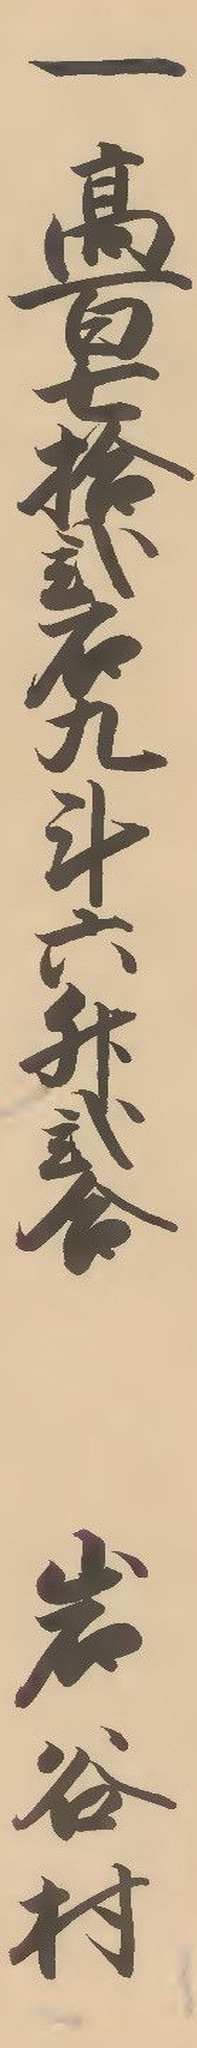一高百七拾弐石九斗六升弐合岩谷村
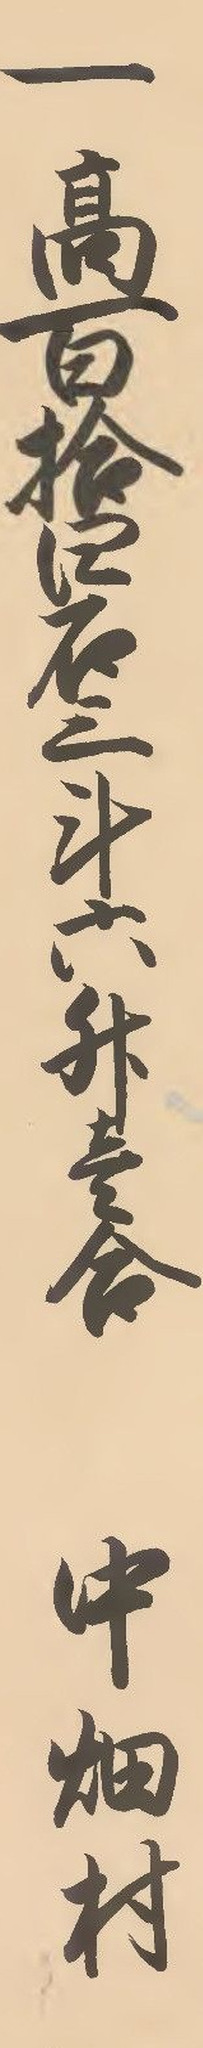一高百拾四石三斗六升壱合中畑村
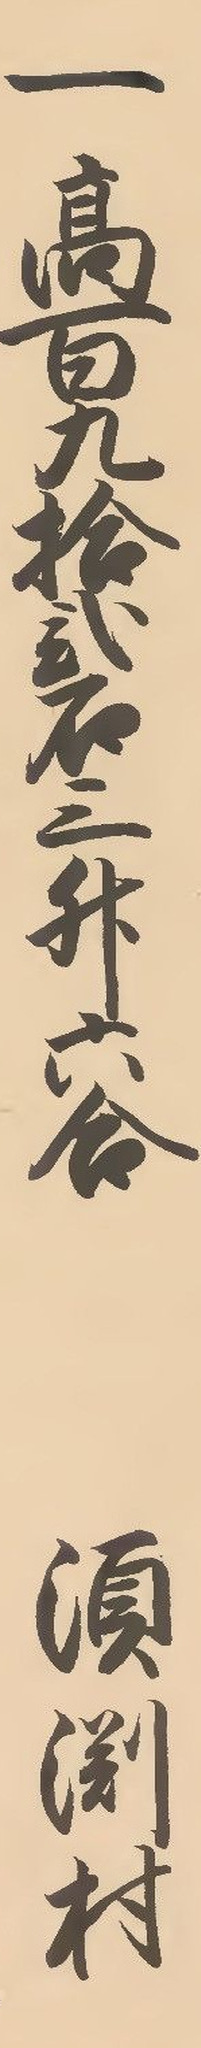一高百九拾弐石三升六合須淵村
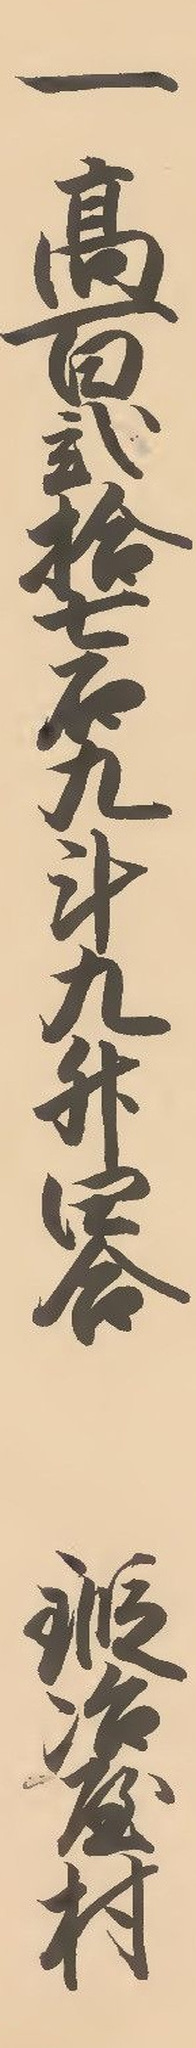一高百弐拾七石九斗九升四合鍛冶屋村
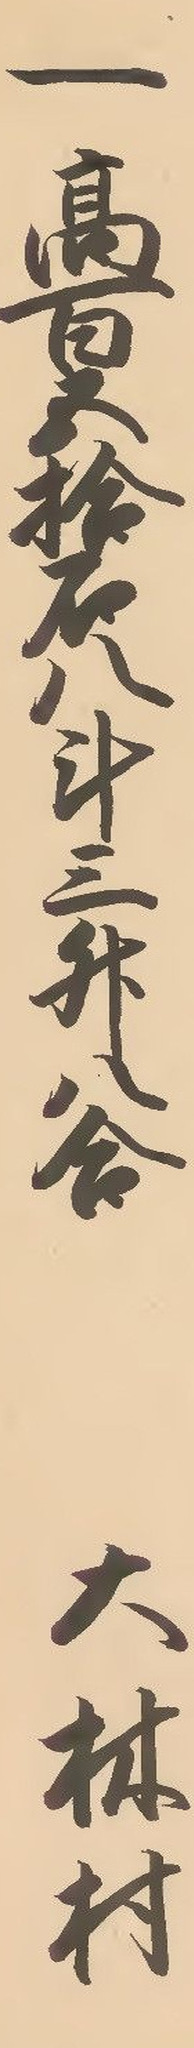一高百五拾石八斗三升八合大林村
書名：三河国郷帳
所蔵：国立公文書館 National Archives of Japan
